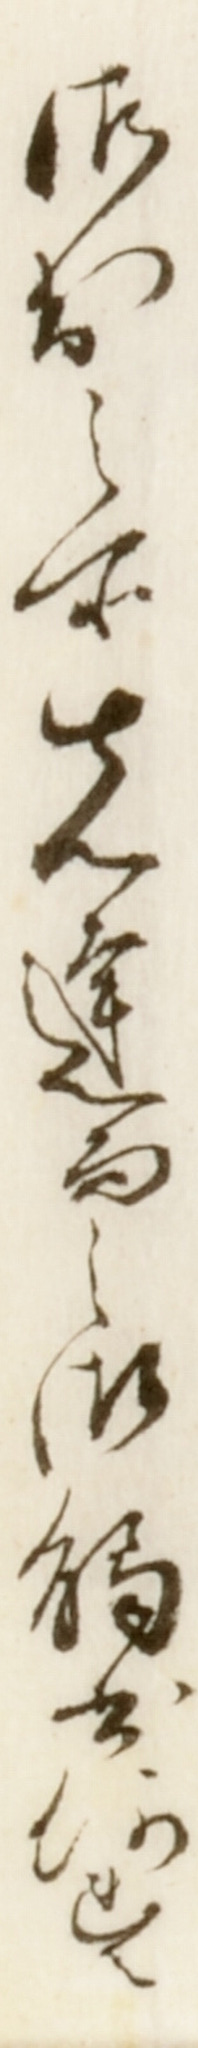御出之所先達而之御触書れ之
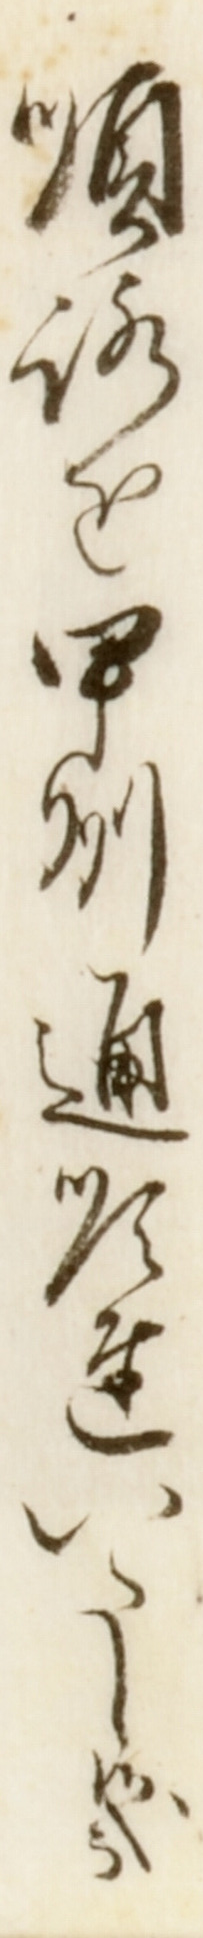順路を甲州通順達いたし候哉
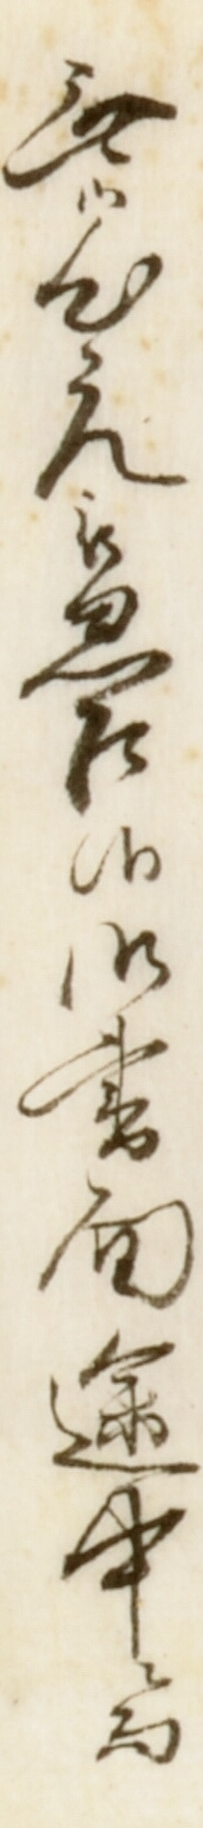無御心元被思召候御書面途中ニ而
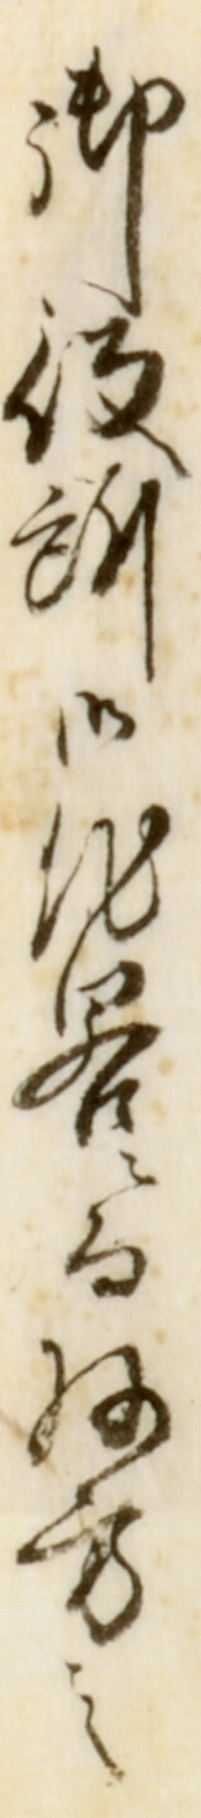御役所御作略ニ而何方之
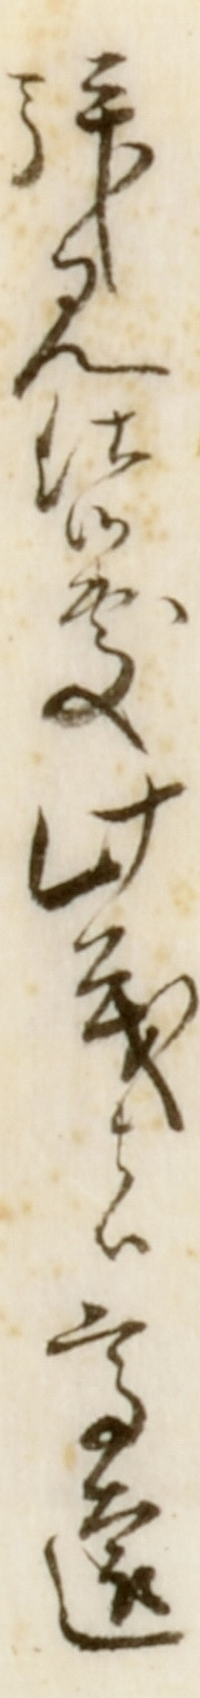拝見仕候處此義者高遠

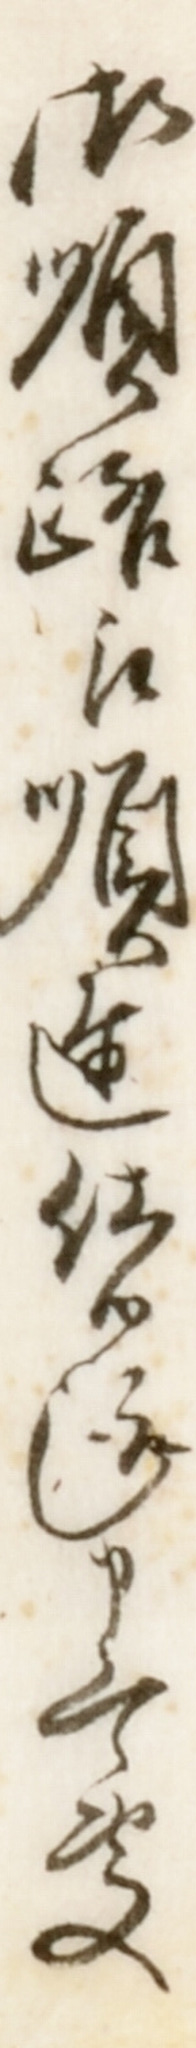御順路江順達仕候趣申上候處
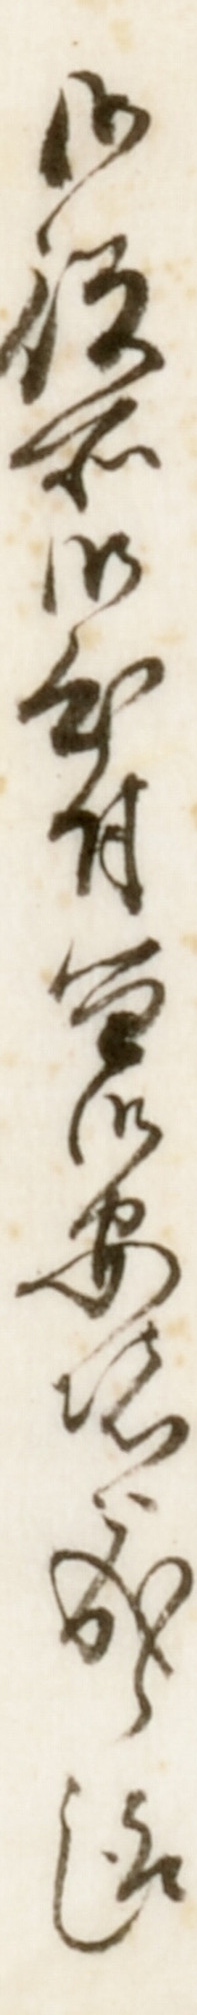御役所御心付宜御安堵被成候趣
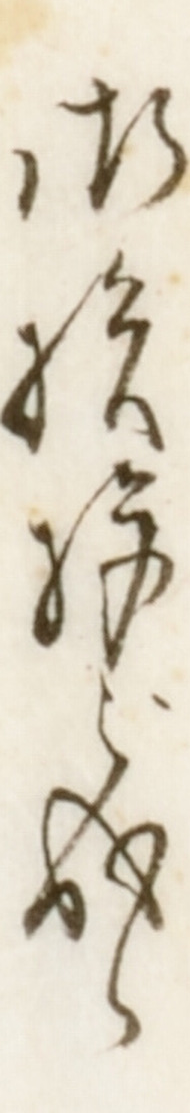御挨拶被成候
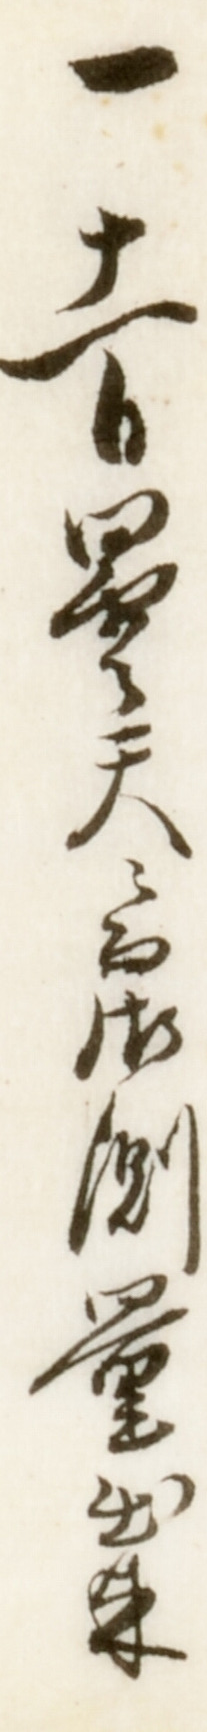一十一日曇天ニ而御測量出来
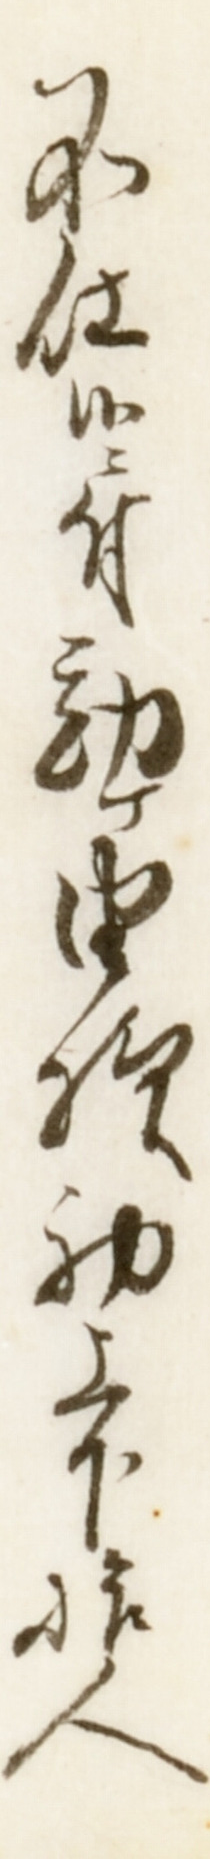不仕候ニ付勘ケ由様初上下拾人
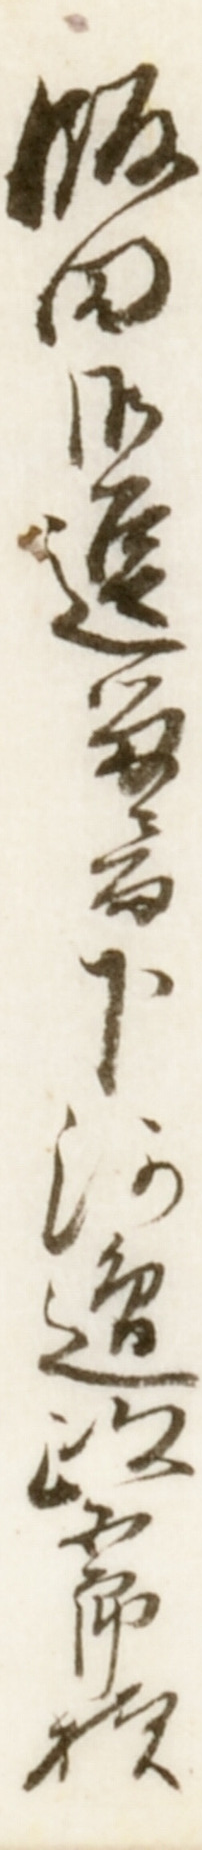飯田御逗留ニ而下河辺政五郎様
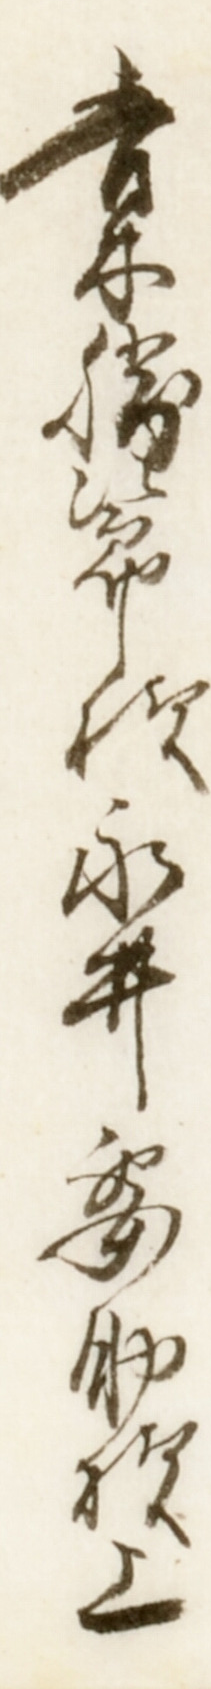青木勝次郎様永井要助様上
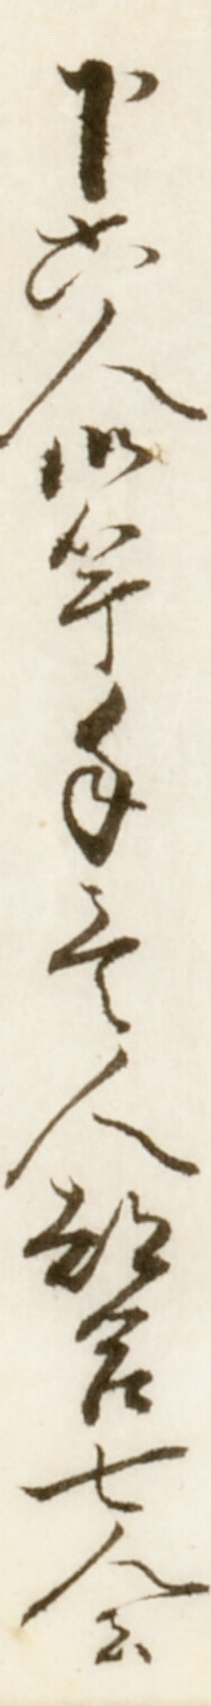下六人御竿手壱人都合七人者
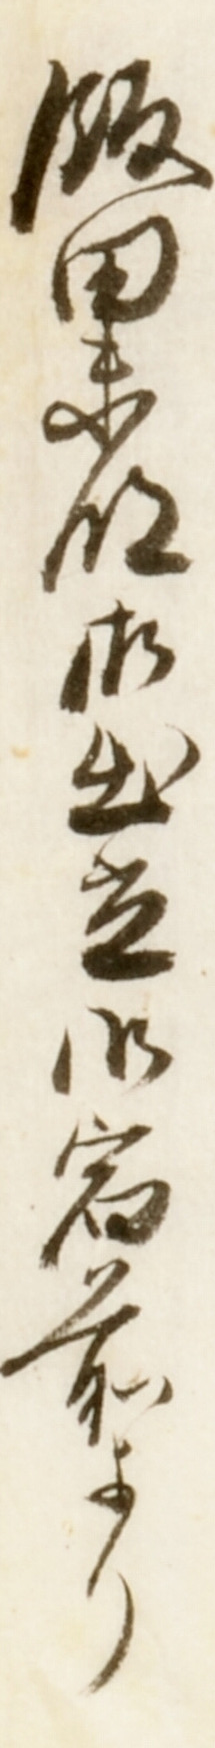飯田未明御出立御宿前より
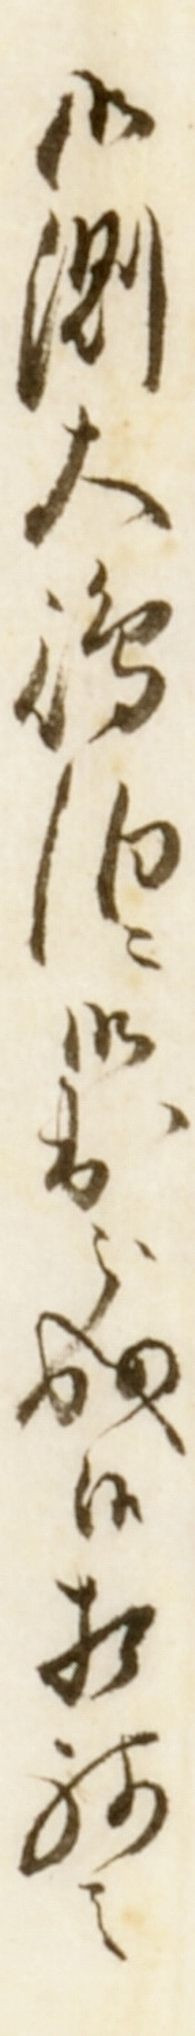御測大嶋泊ニ御出被成候相残之
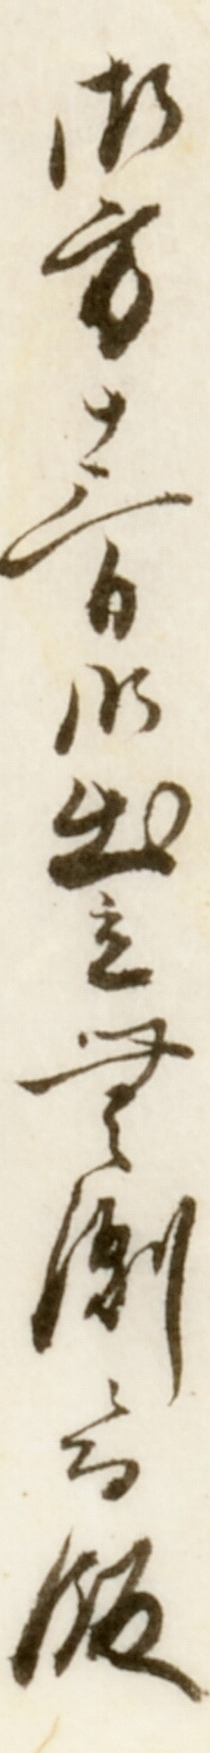御方十三日御出立無測ニ而飯
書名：諸事書上
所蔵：伊那市立高遠町図書館・合同会社AMANE
